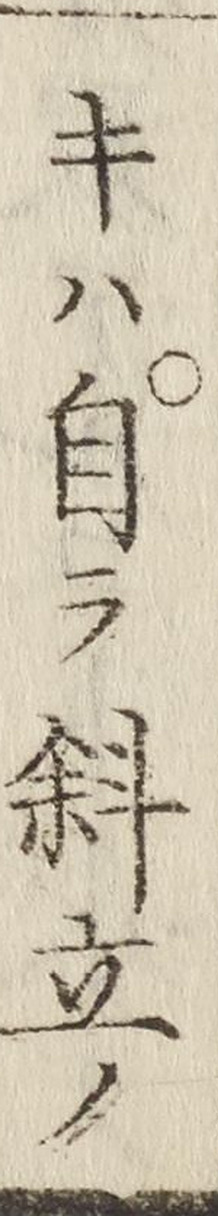キハ。自ラ斜立ノ
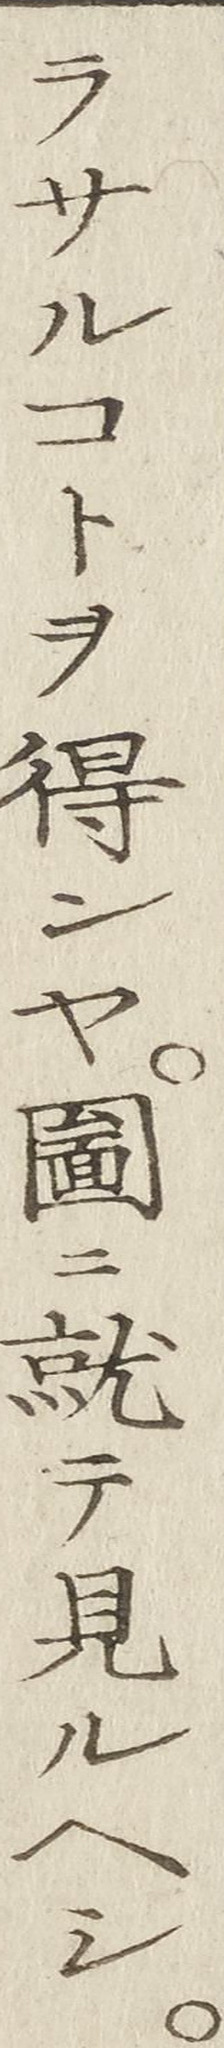ラサルコトヲ得ンヤ。図ニ就テ見ルヘシ。
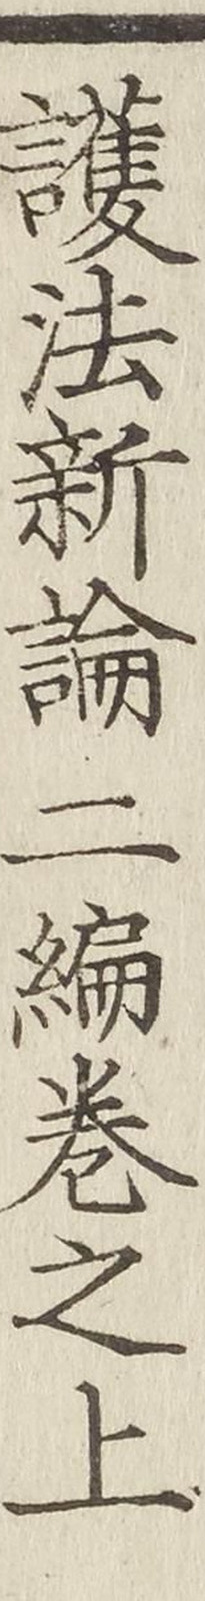護法新論ニ編巻之上
